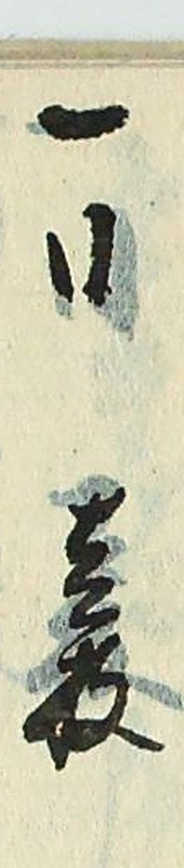一同壱枚同
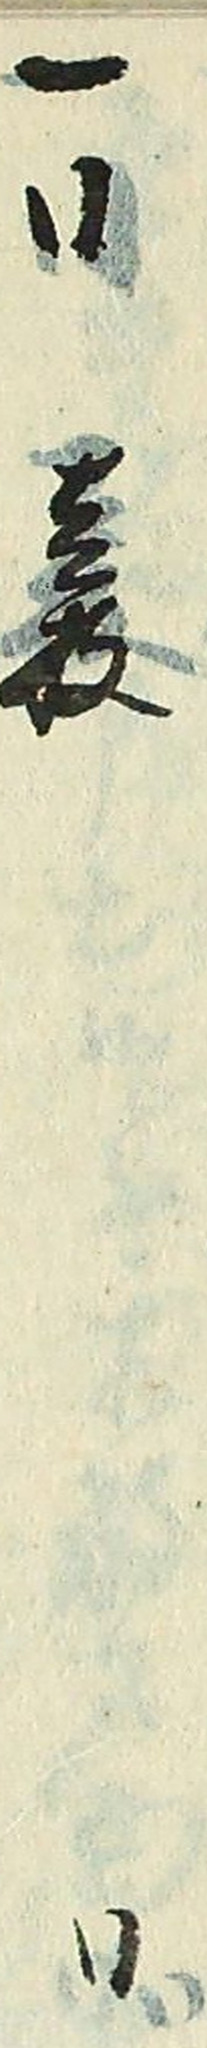一同壱枚同
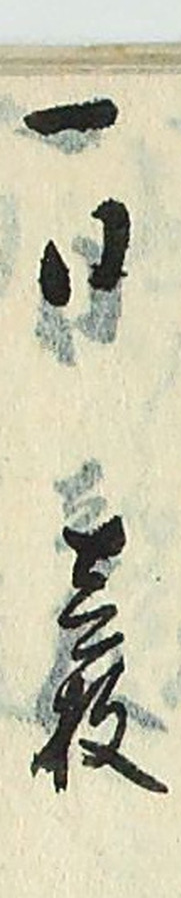一同壱枚同
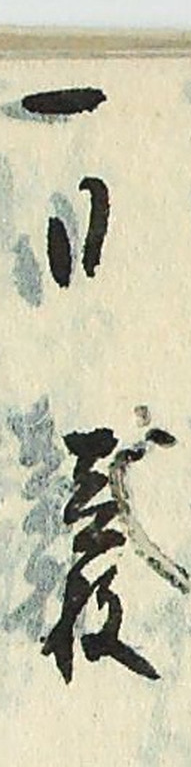一同壱枚同
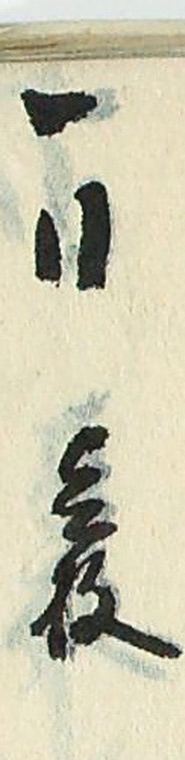一同壱枚同

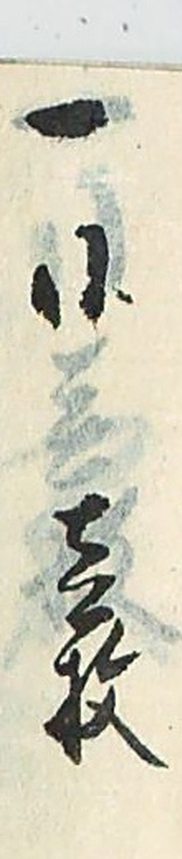一同壱枚同
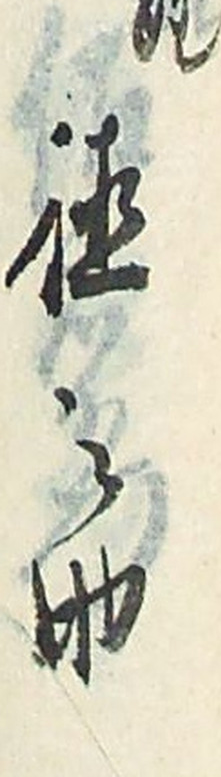徳之助
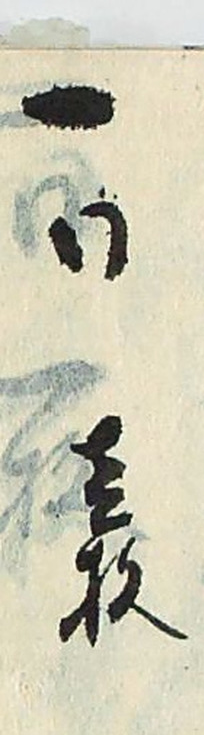一同壱枚同
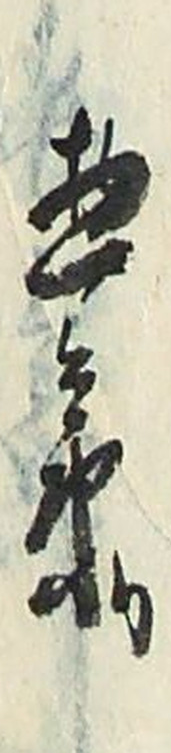惣兵衛
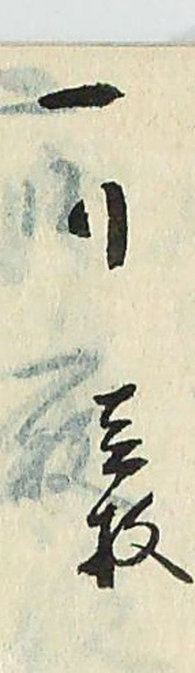一同壱枚同
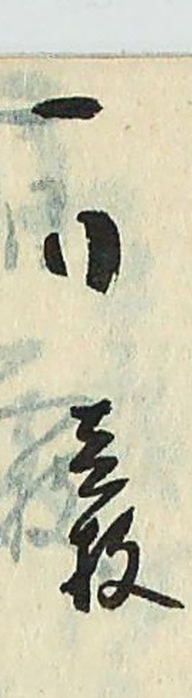一同壱枚同
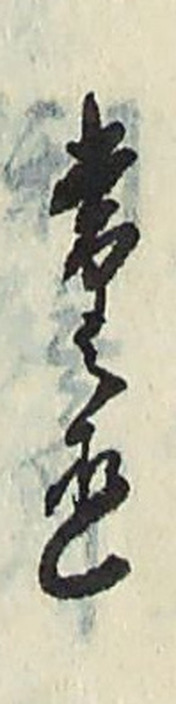常之丞
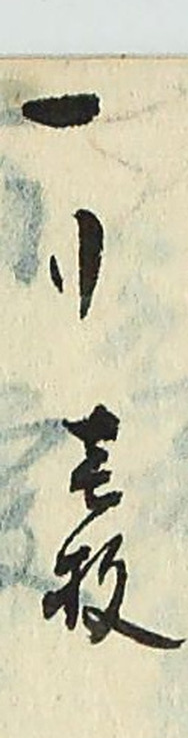一同壱枚同
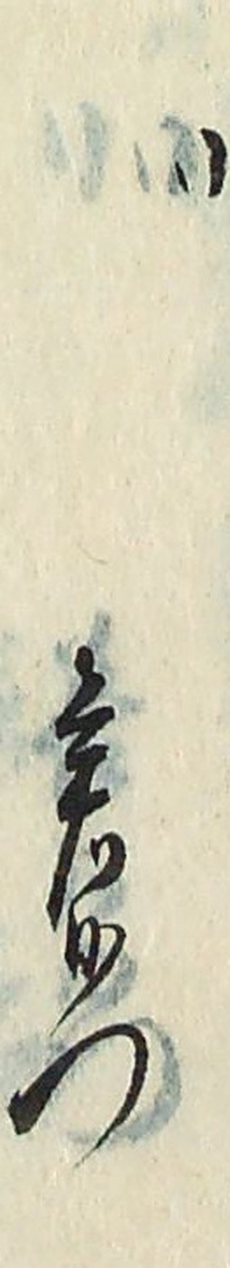兵右衛門
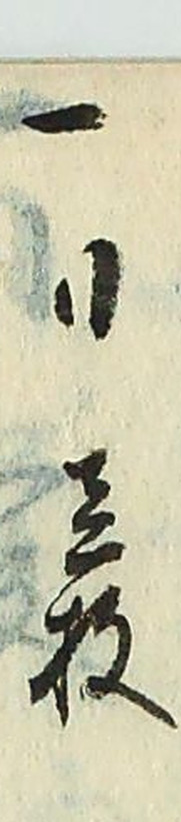一同壱枚同
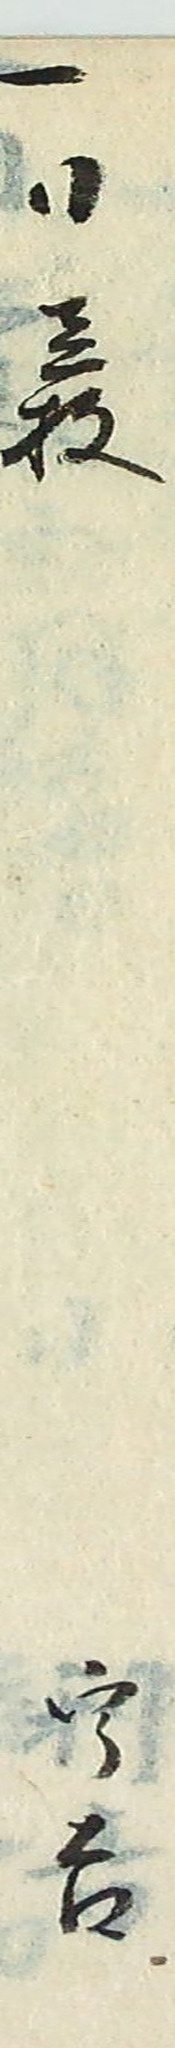一同壱枚同
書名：諸御用御□受書控
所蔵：鳴門教育大学 Naruto University of Education
